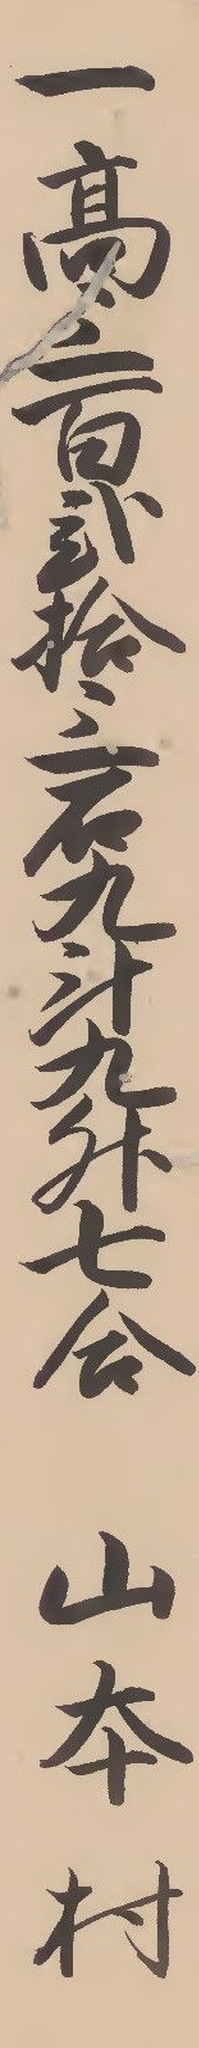一高三百弐拾三石九斗九升七合山本村
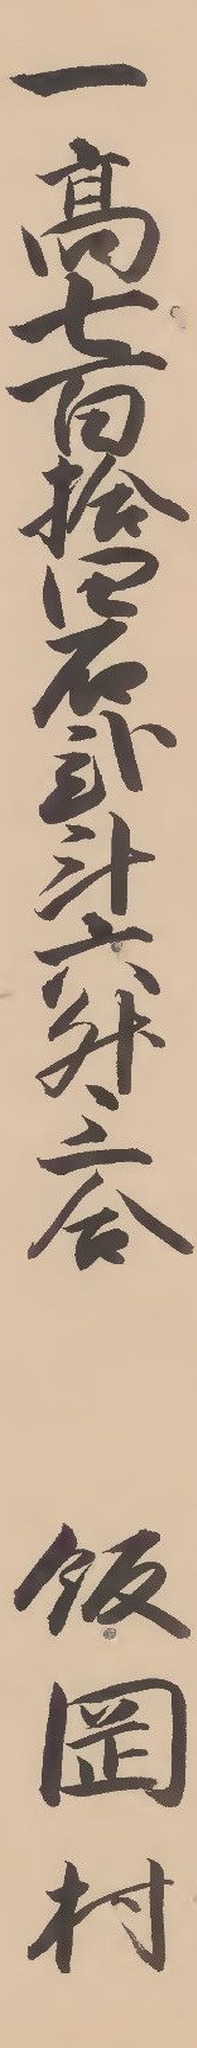一高七百拾四石弐斗六升三合飯岡村
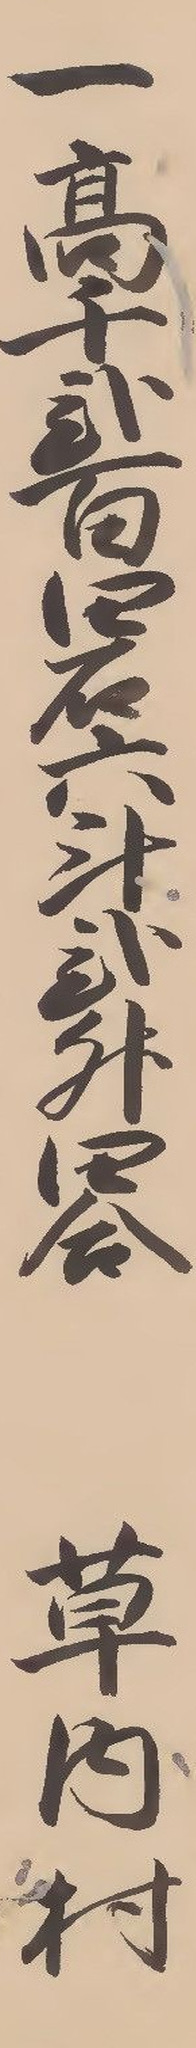一高千弐百四石六斗弐升四合草内村

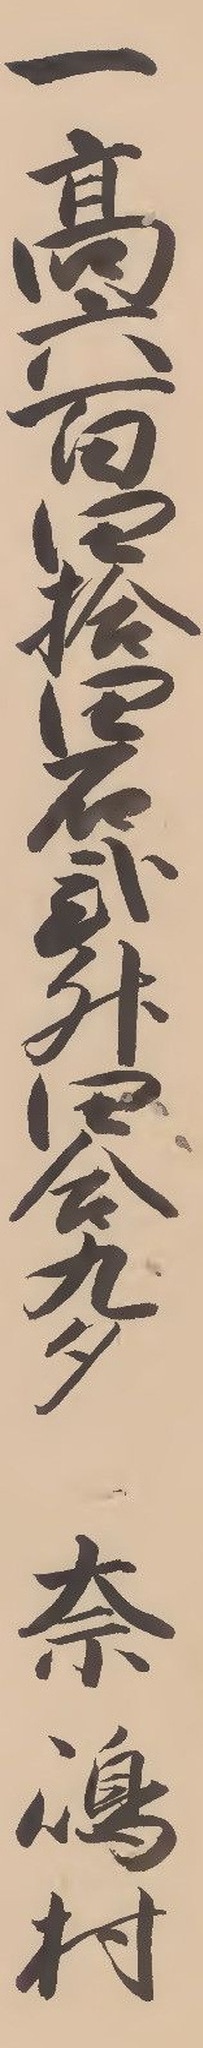一高六百四拾四石弐升四合九勺奈嶋村
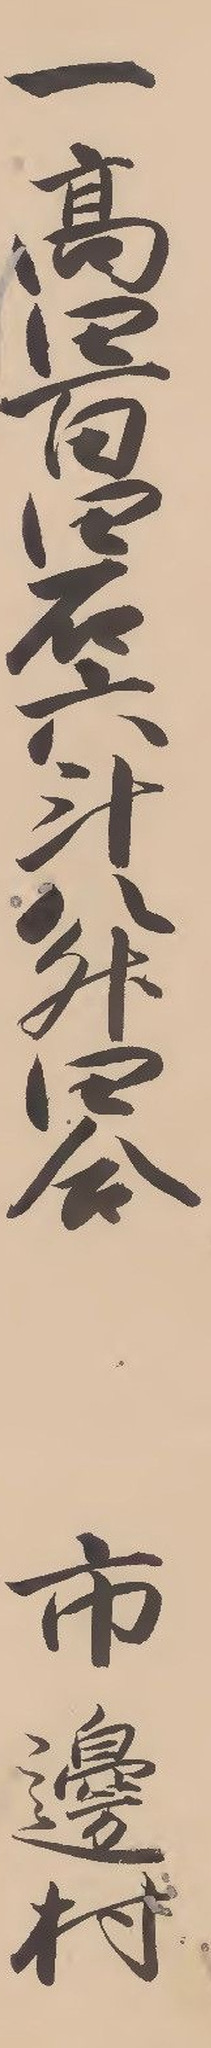一高四百四石六斗八升四合市辺村
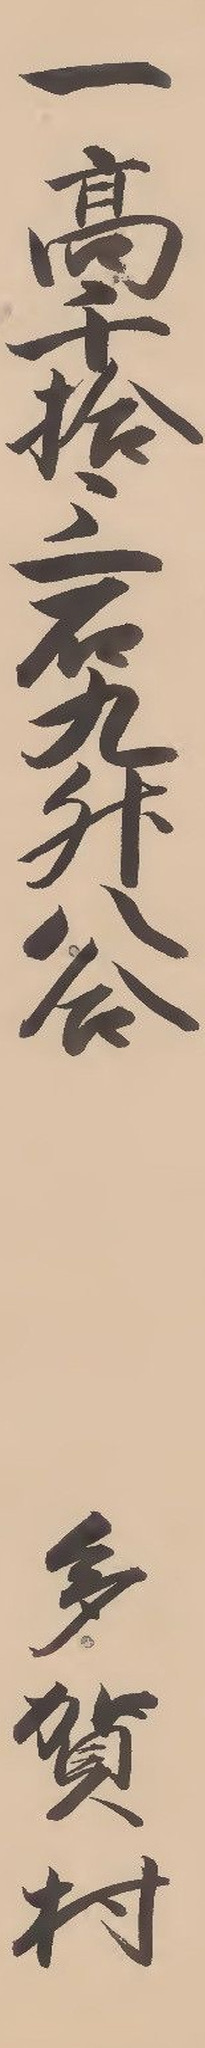一高千拾三石九升八合多賀村
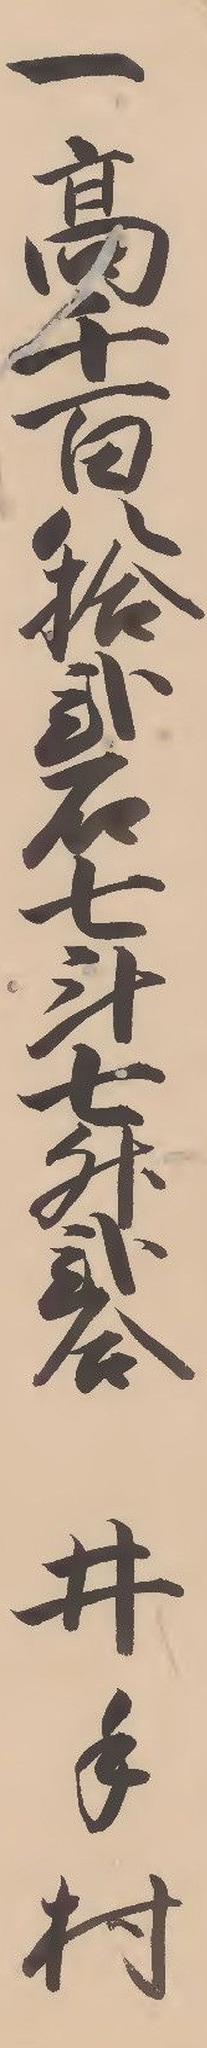一高千百八拾弐石七斗七升弐合井手村
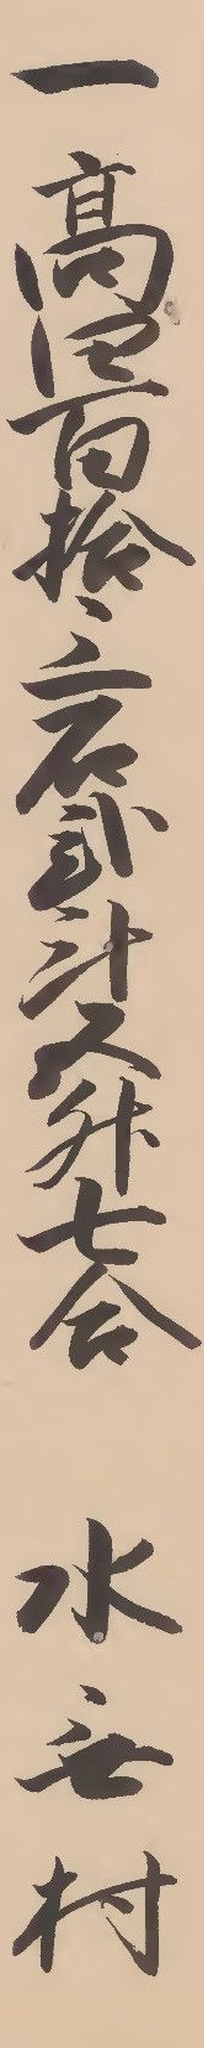一高四百拾三石弐斗五升七合水無村
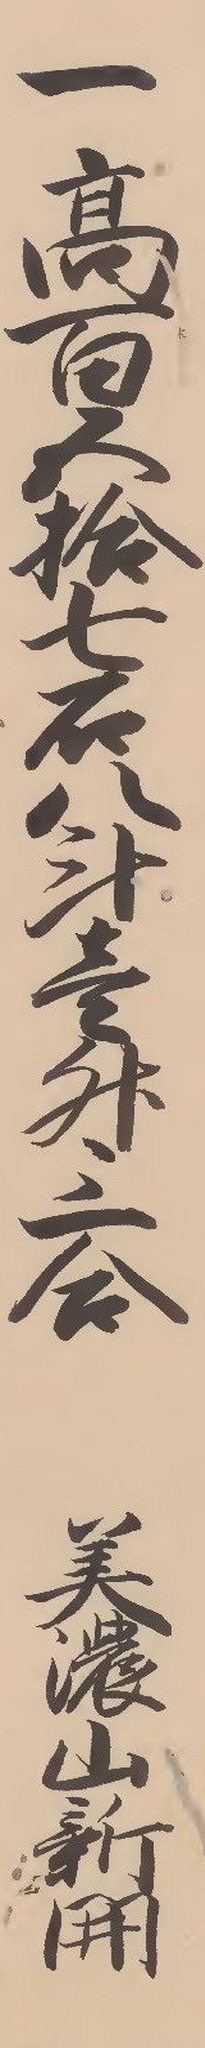一高百五拾七石八斗壱升三合美濃山新開
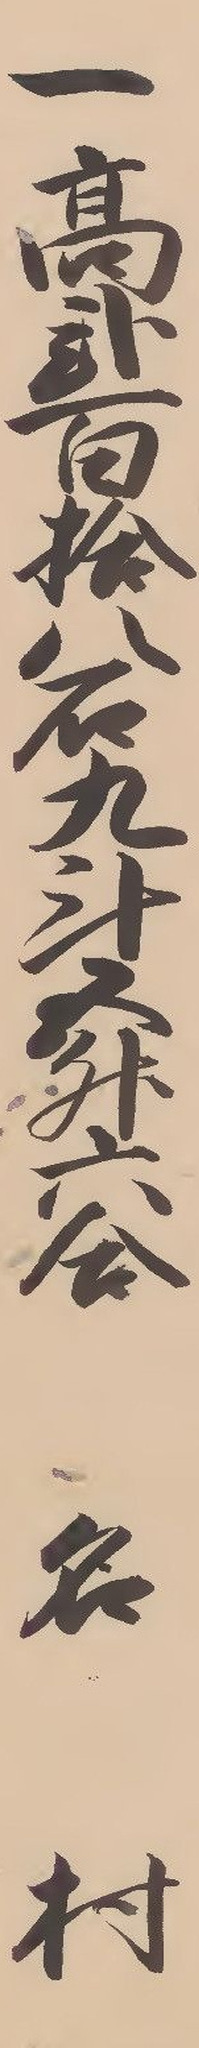一高弐百拾八石九斗五升六合名村

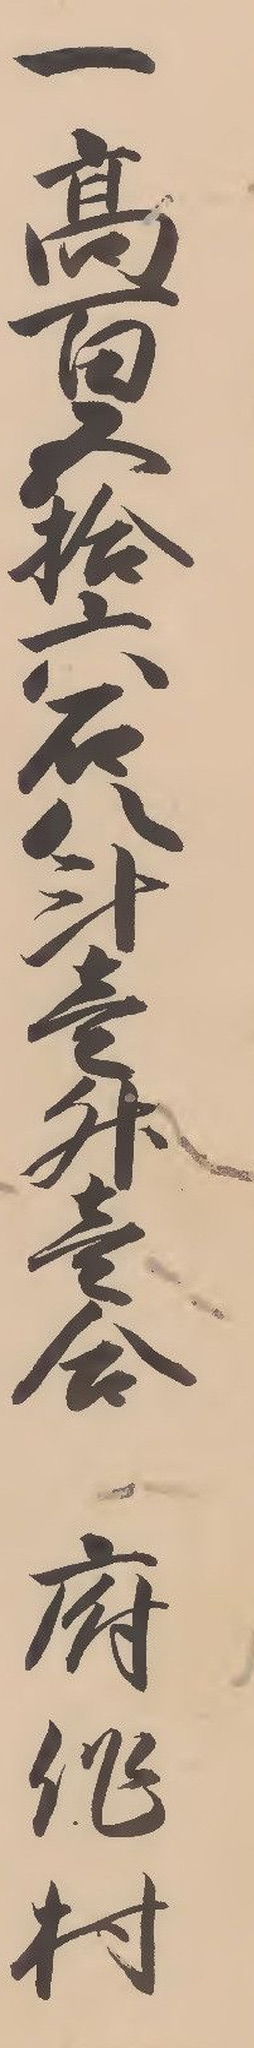一高百五拾六石八斗壱升壱合府作村
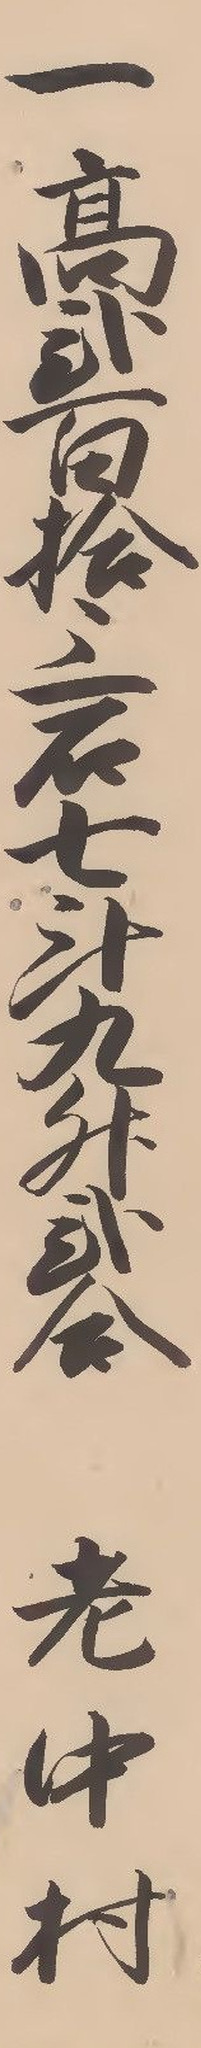一高弐百拾三石七斗九升弐合老中村
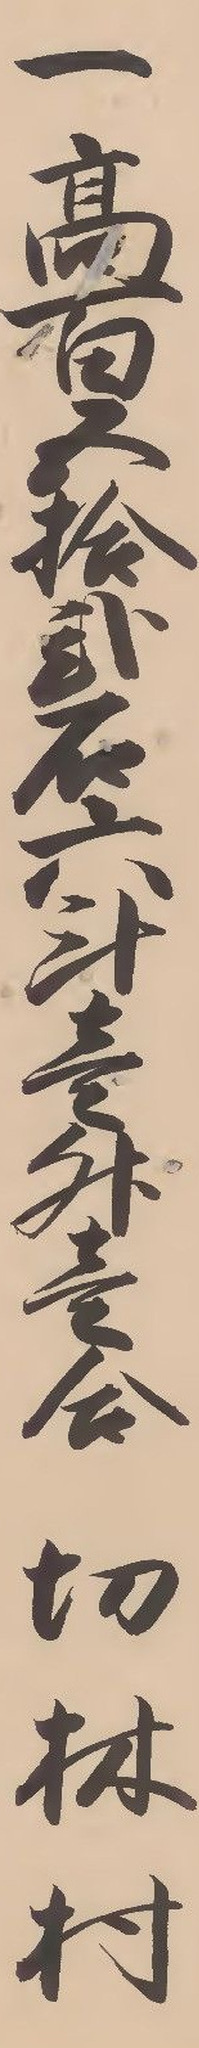一高百五拾弐石六斗壱升壱合切林村
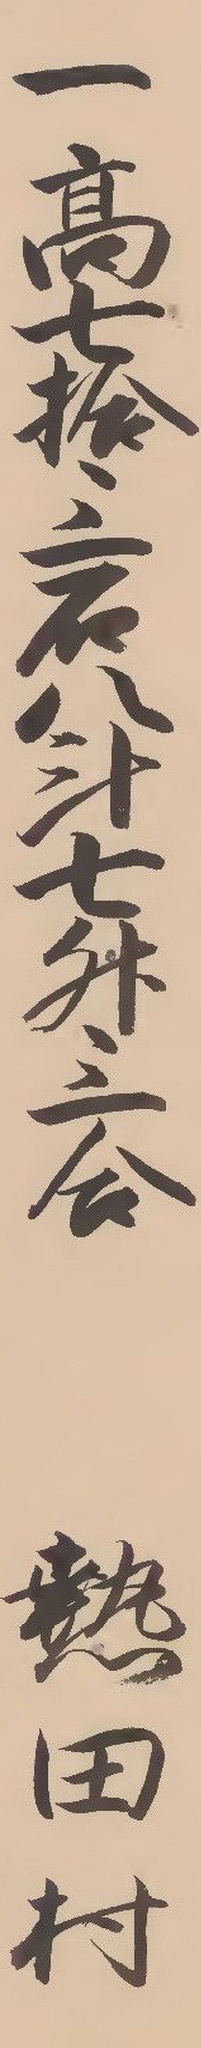一高七拾三石八斗七升三合熱田村
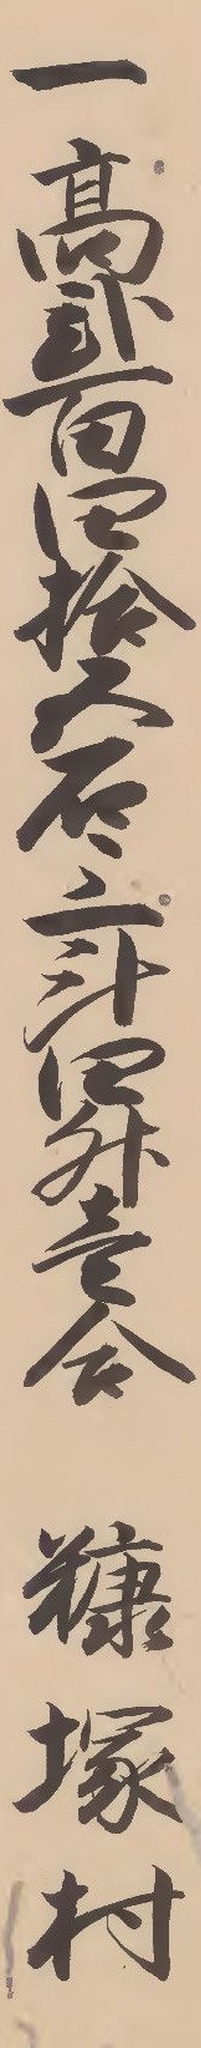一高弐百四拾五石三斗四升壱合糠塚村
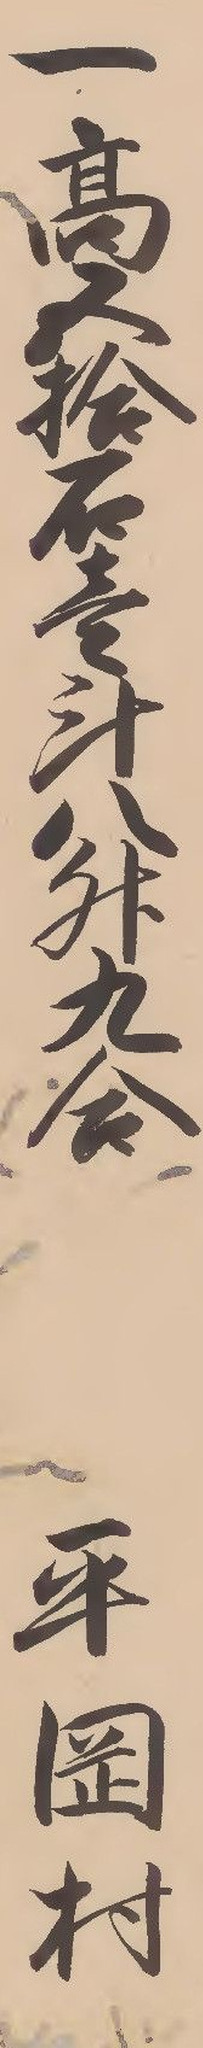一高五拾石壱斗八升九合平岡村
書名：山城国郷帳
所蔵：国立公文書館 National Archives of Japan
